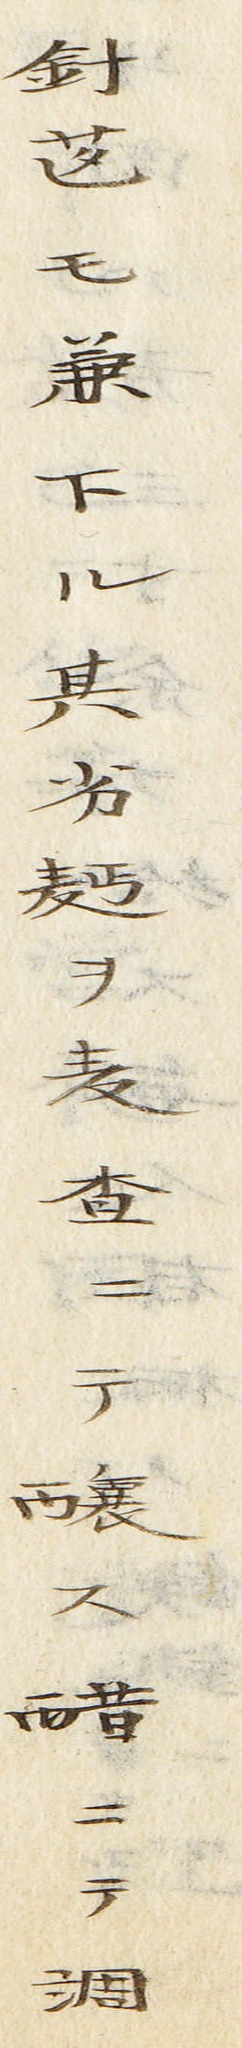針モ兼下ル其劣麪ヲ麦𩠺ニテ醸ス醋ニテ調
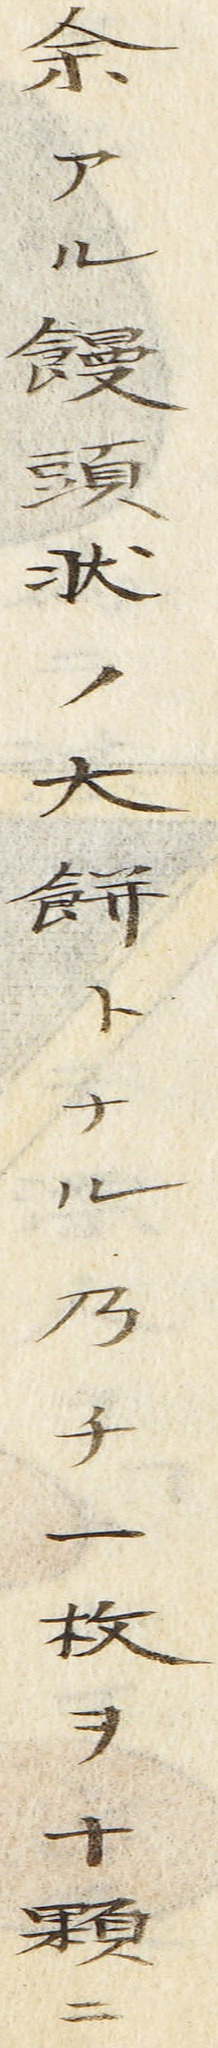余アル饅頭状ノ大餅トナル乃チ一枚ヲ十顆ニ
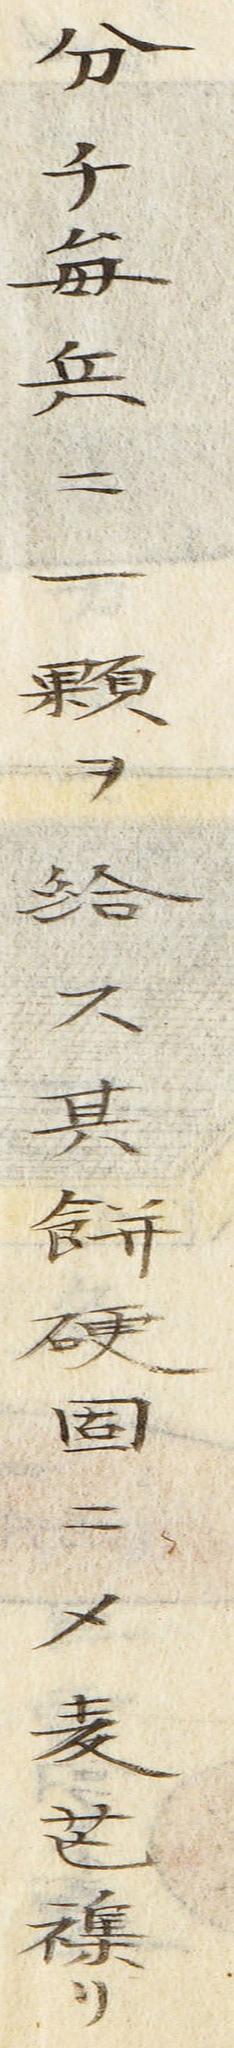分チ毎兵ニ一顆ヲ給ス其餅硬固ニシテ麦芒襍リ
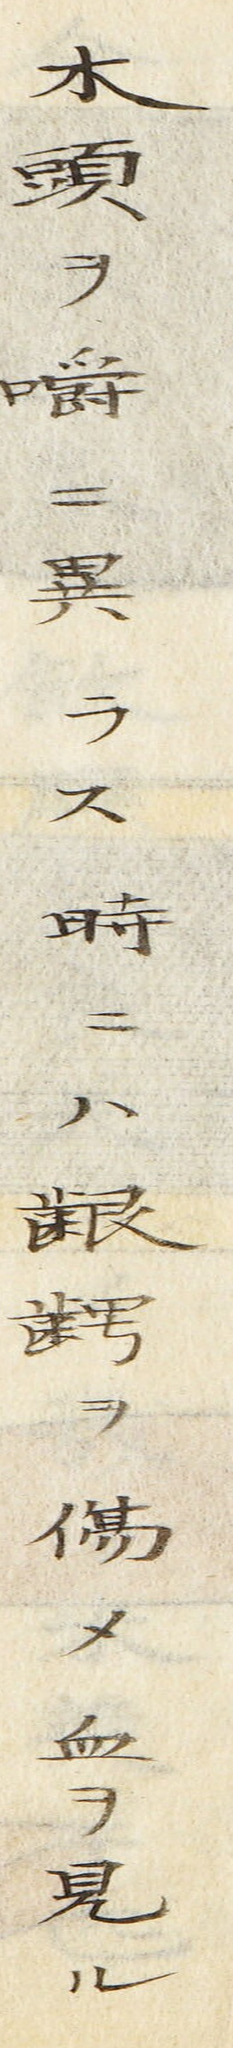木頭ヲ嚼ニ異ラス時ニハ齦齶ヲ傷シテ血ヲ見ル
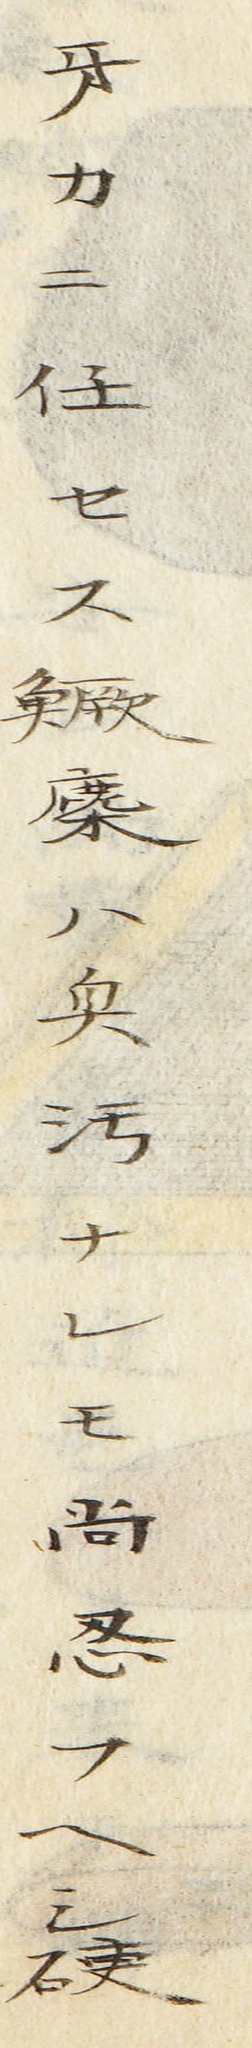牙力ニ任セス鱖䴢ハ臭汚ナレモ尚忍フヘシ硬
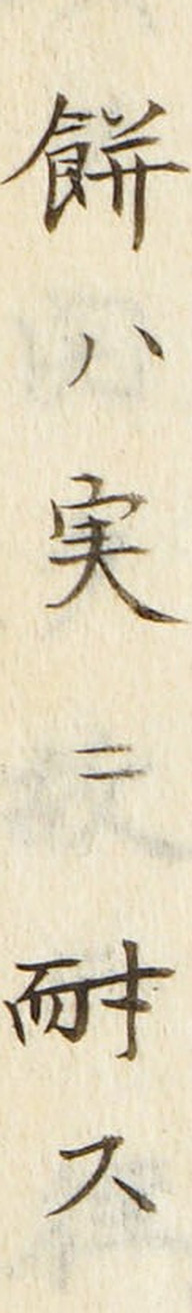餅ハ実ニ耐ス

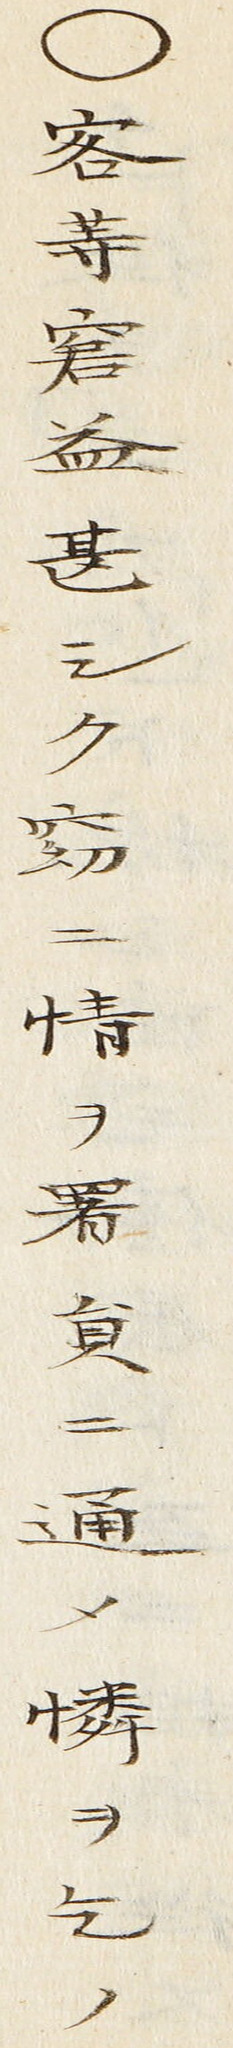○客等窘益甚シク窈ニ情ヲ署員ニ通シテ憐ヲ乞ノ
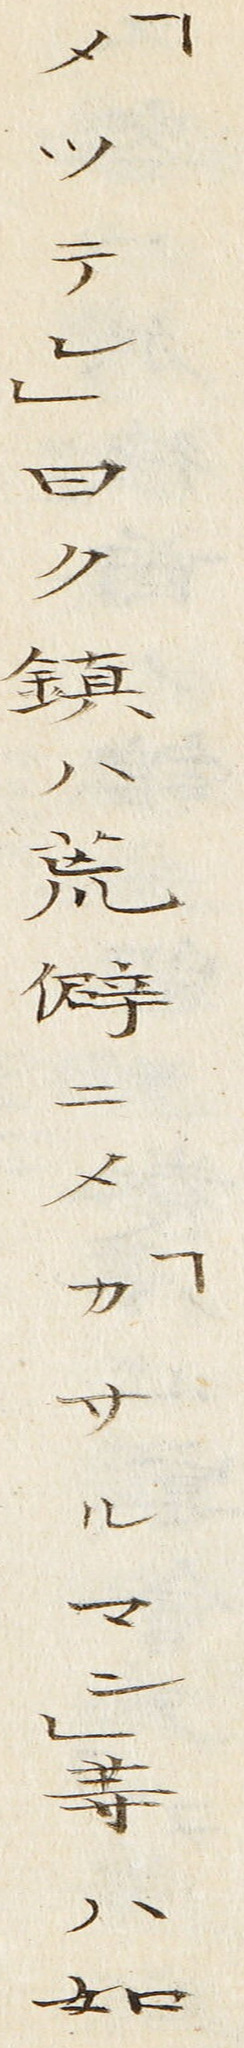「メツテレ」曰ク鎮ハ荒僻ニシテ「カサルマン」等ハ如
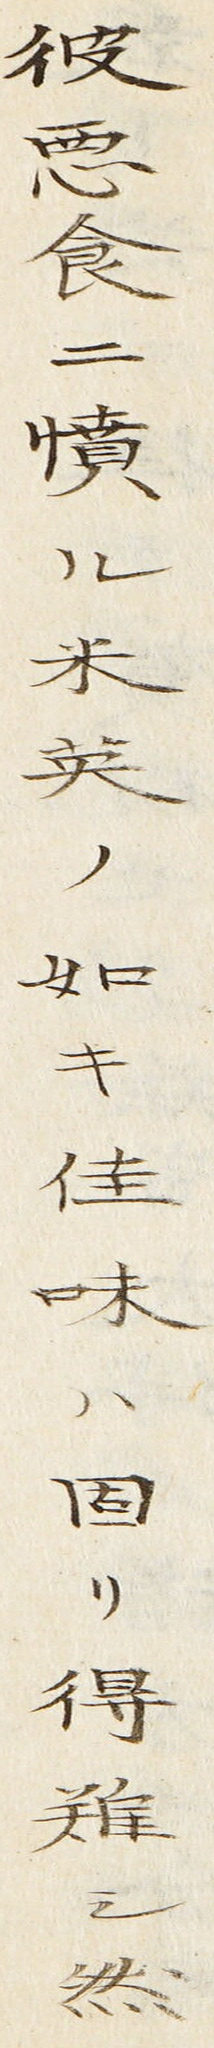彼悪食ニ憤ル米英ノ如キ佳味ハ固リ得難シ然
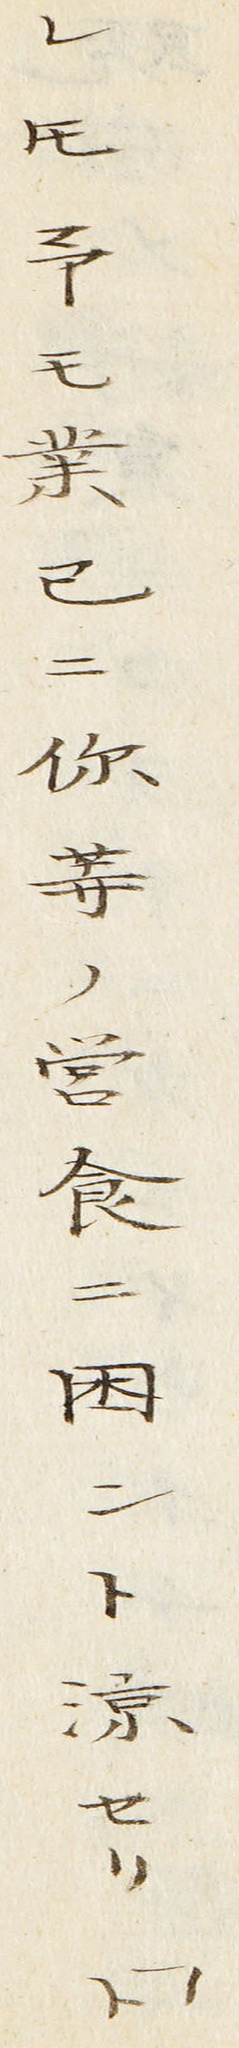レトモ予モ業己ニ你等ノ営食ニ困ント涼セリ「ト
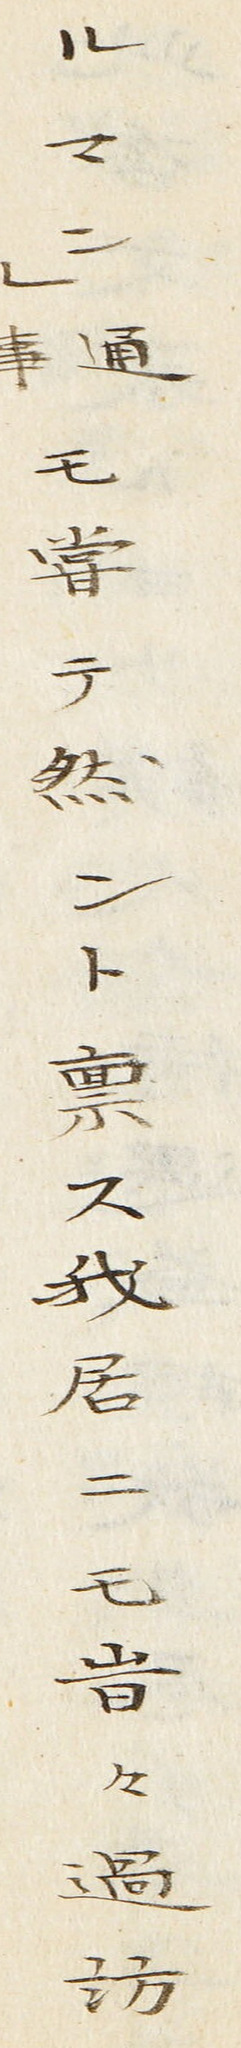ルマン」通事モ甞テ然ント禀ス我居ニモ旹々過訪
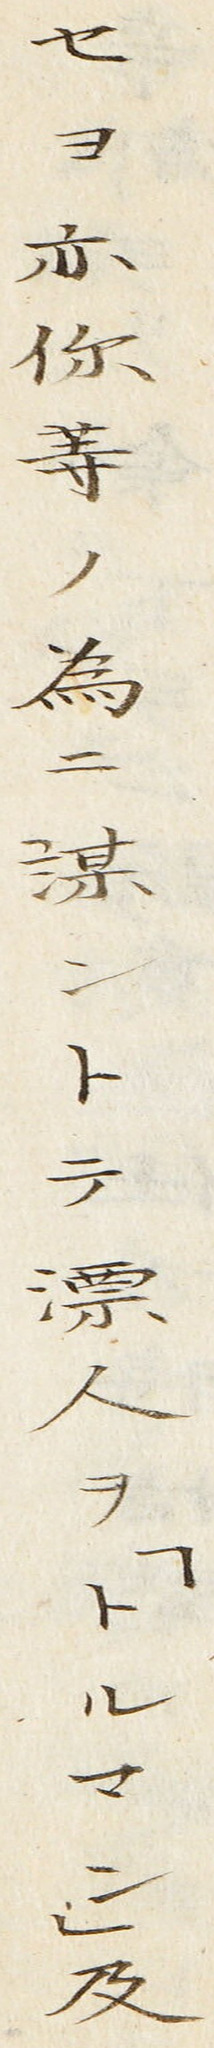セヨ亦你等ノ為ニ謀ントテ漂人ヲ「トルマン」及
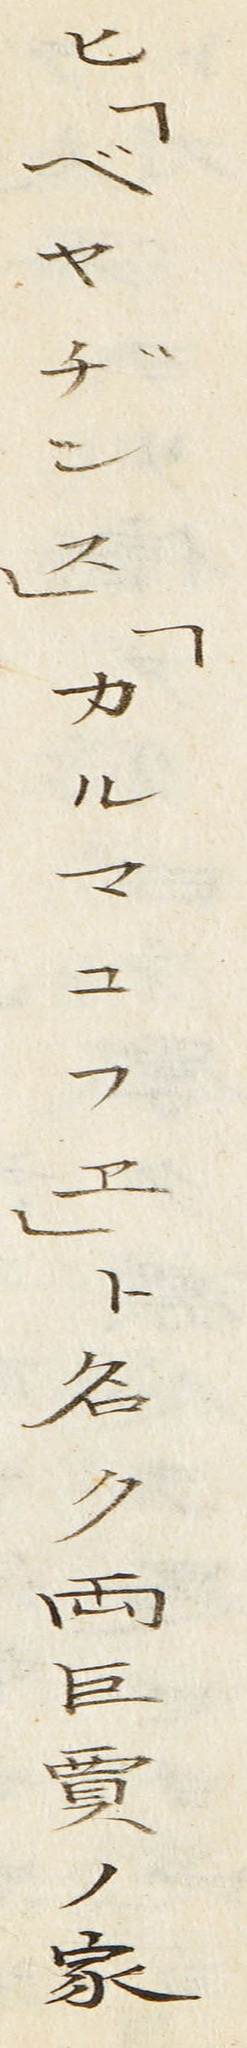ヒ「ベヤヂンス」「カルマユフヱ」ト名ク両巨賈ノ家
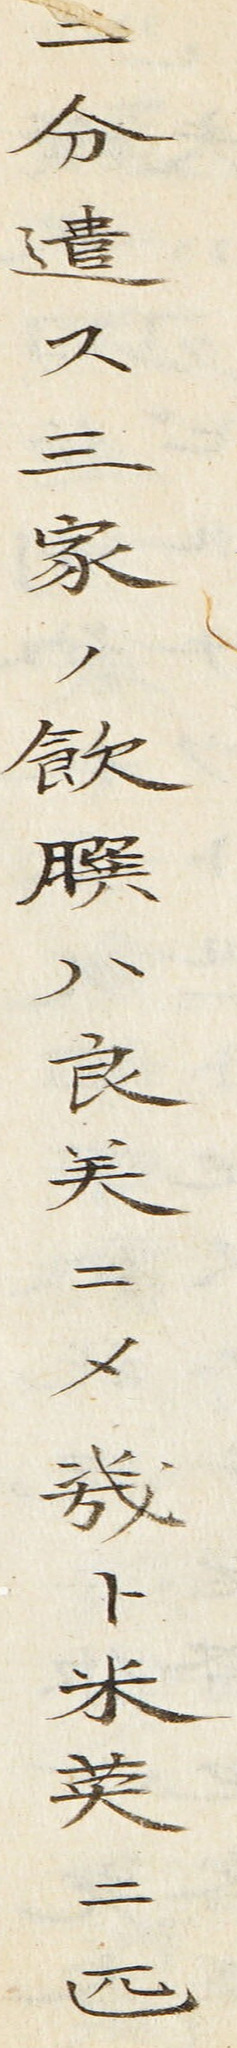ニ分遣ス三家ノ飲𦠆ハ良美ニシテ幾ト米英ニ匹
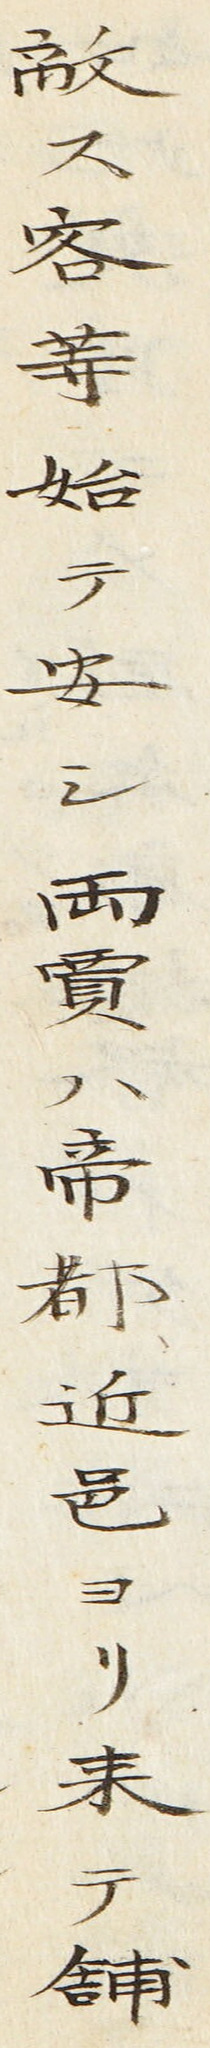敵ス客等始テ安シ両賈ハ帝都近邑ヨリ来テ舗

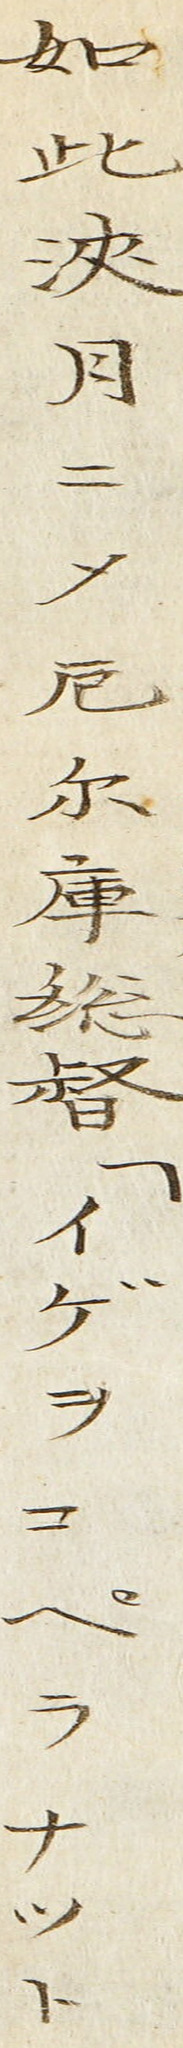○如此浹月ニシテ厄尓庫総督「イゲヲコペラナツト
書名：流蕃通書
